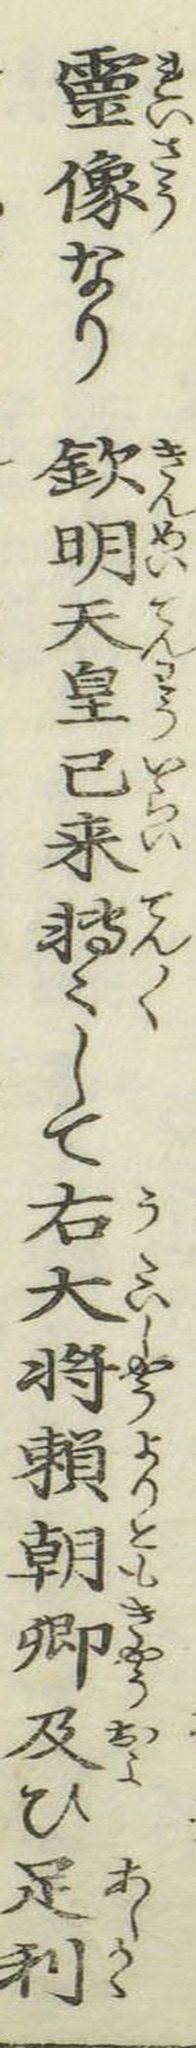霊像なり欽明天皇已来轉々して右大将頼朝卿及ひ足利
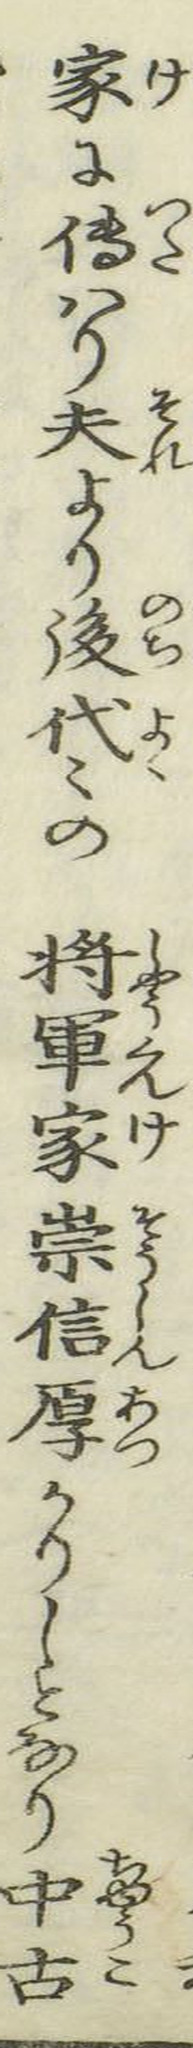家に傳はり夫より後代々の将軍家崇信厚かりしとなり中古
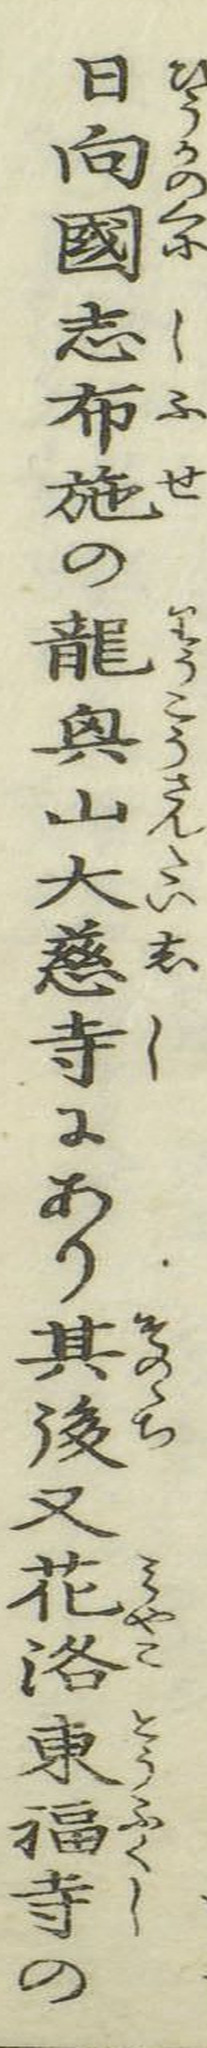日向國志布施の龍興山大慈寺にあり其後又花洛東福寺の

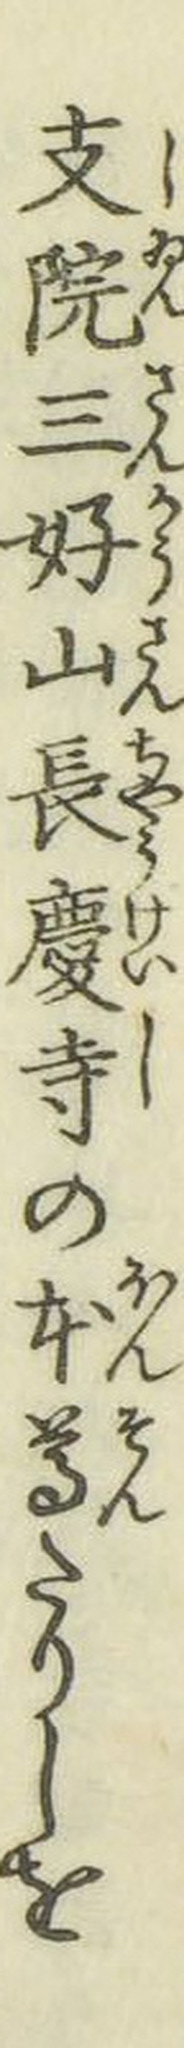支院三好山長慶寺の本尊たりしを
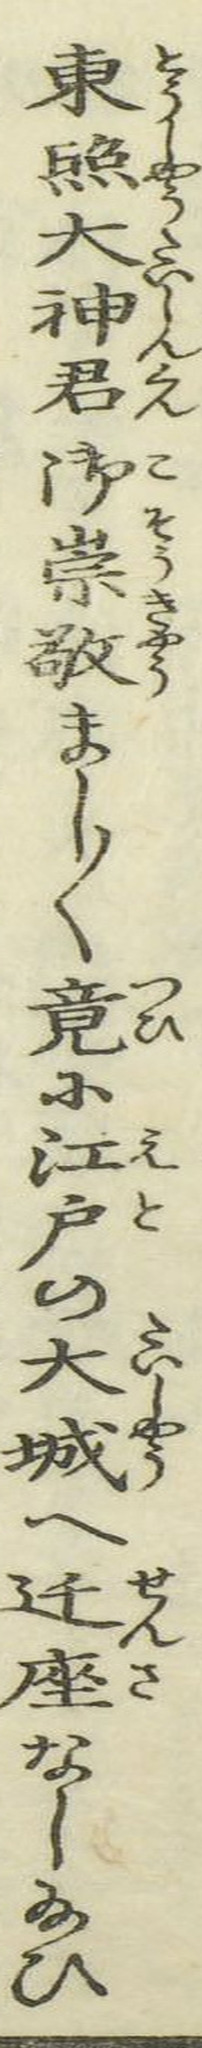東照大神君御崇敬まし〳〵竟に江戸の大城へ迁座なし給ひ
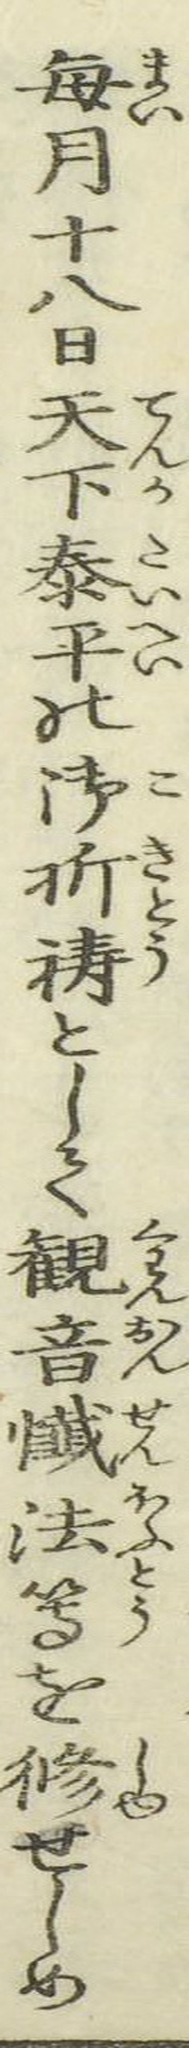毎月十八日天下泰平の御祈祷として観音懺法等を修せしめ
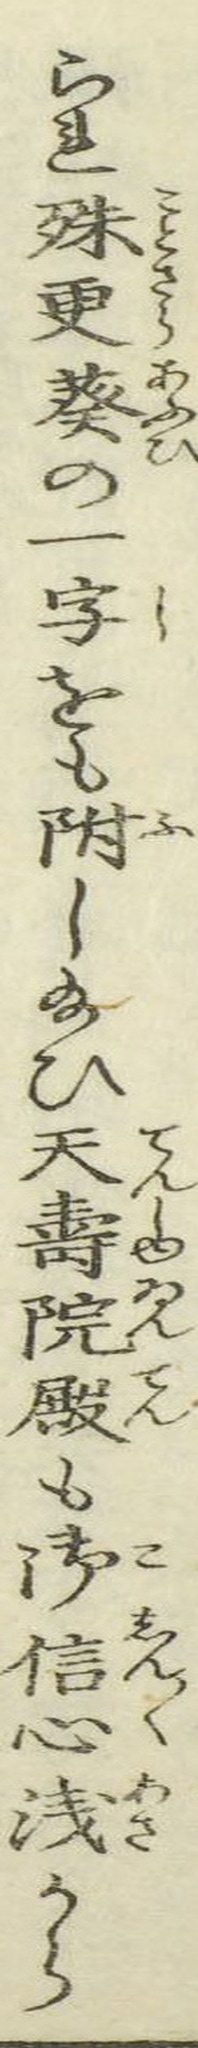られ殊更葵の一字をも附し給ひ天壽院殿も御信心浅から
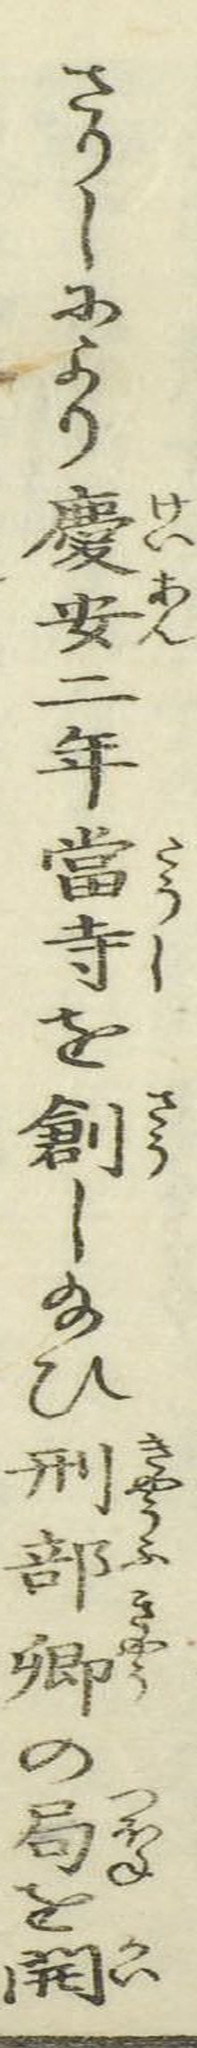さりしにより慶安二年當寺を創し給ひ刑部卿の局を開
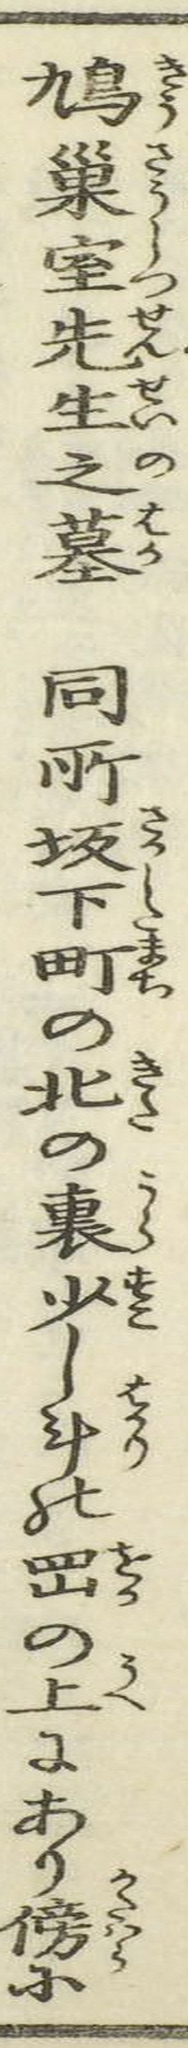鳩巢室先生之墓同所坂下町の北の裏少し斗の岡の上にあり傍に
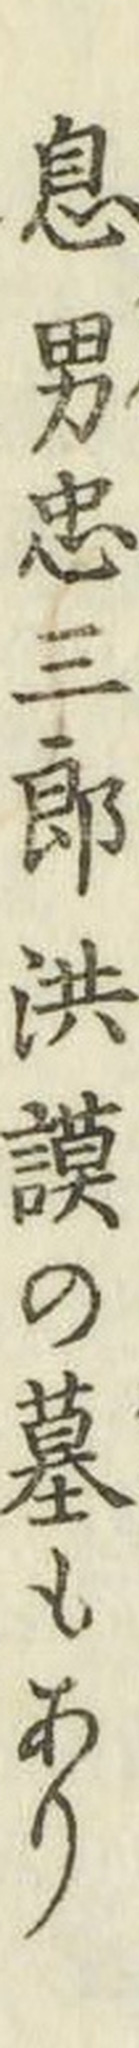息男忠三郎洪謨の墓もあり
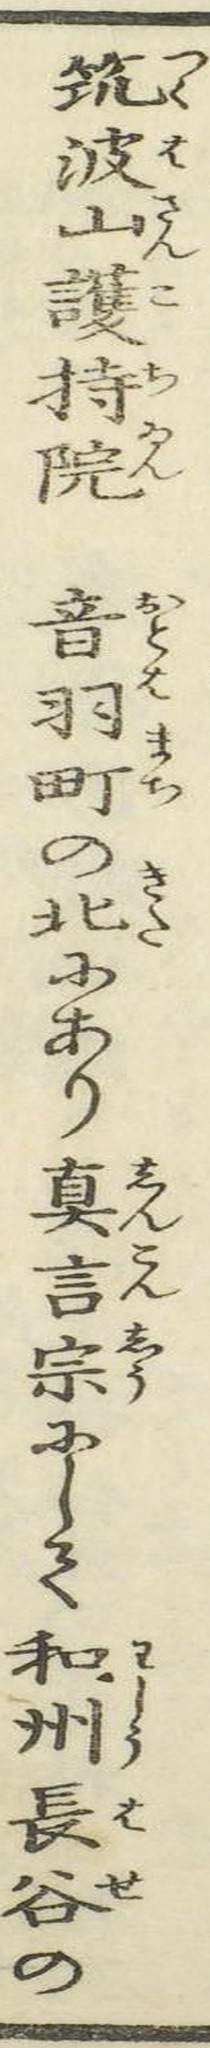筑波山護持院音羽町の北にあり真言宗にして和州長谷の
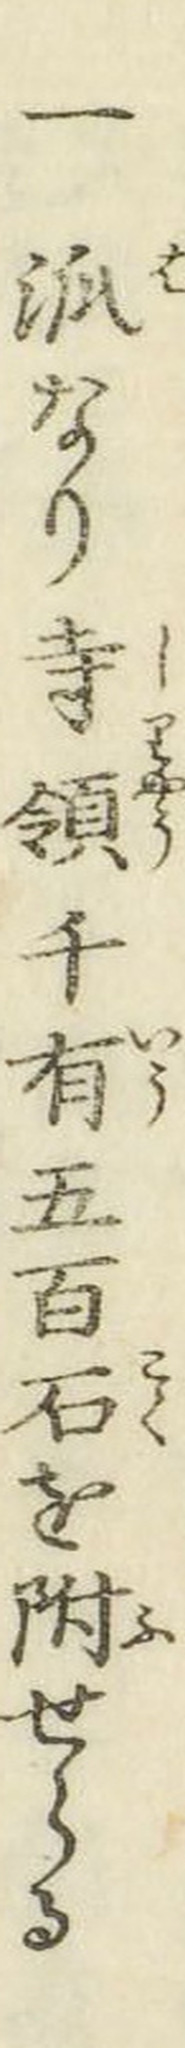一派なり寺領千有五百石を附せらる
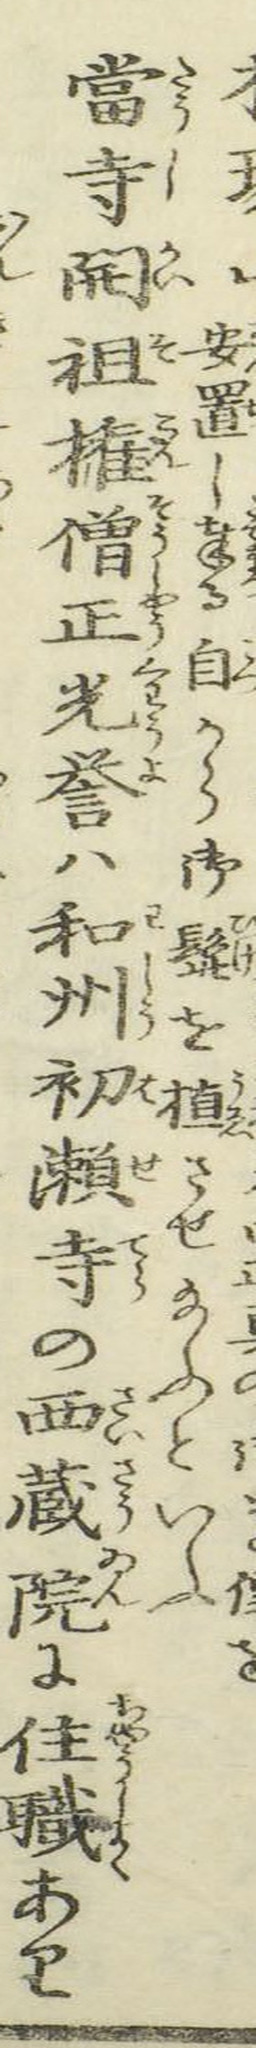當寺開祖権僧正光誉は和州初瀬寺の西蔵院に住職あり
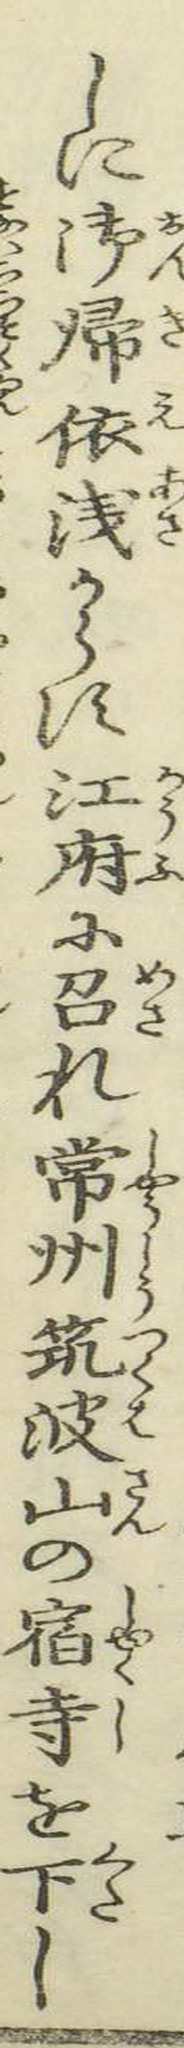しに御帰依浅からす江府に召れ常州筑波山の宿寺を下し
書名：江戸名所図会 20巻 巻之12
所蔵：東京学芸大学教育コンテンツアーカイブ
